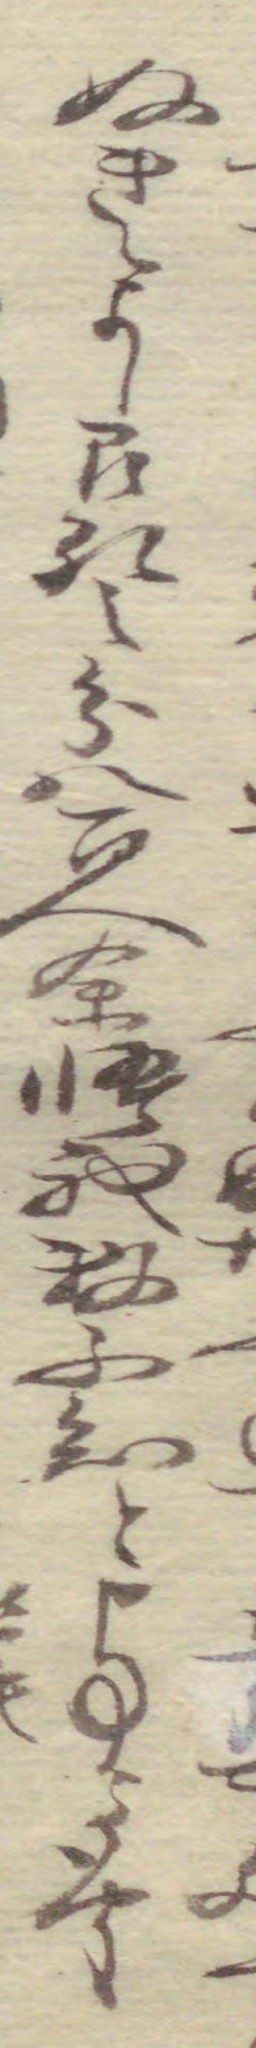ぬき候よし即死之分八百人余怪我数不知と申事ニ御座候
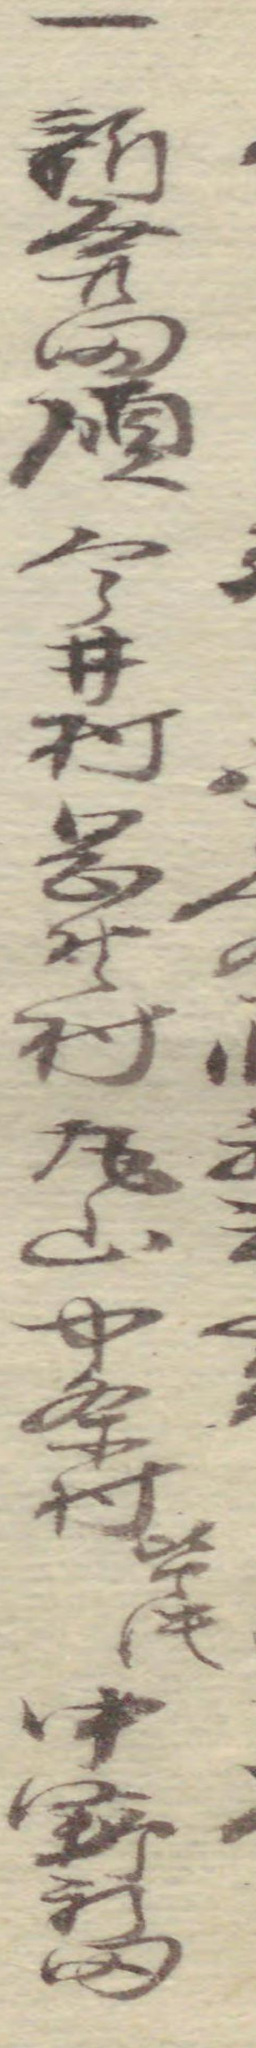一新発田領今井村岡野村丸山中条村皆潰中野新田
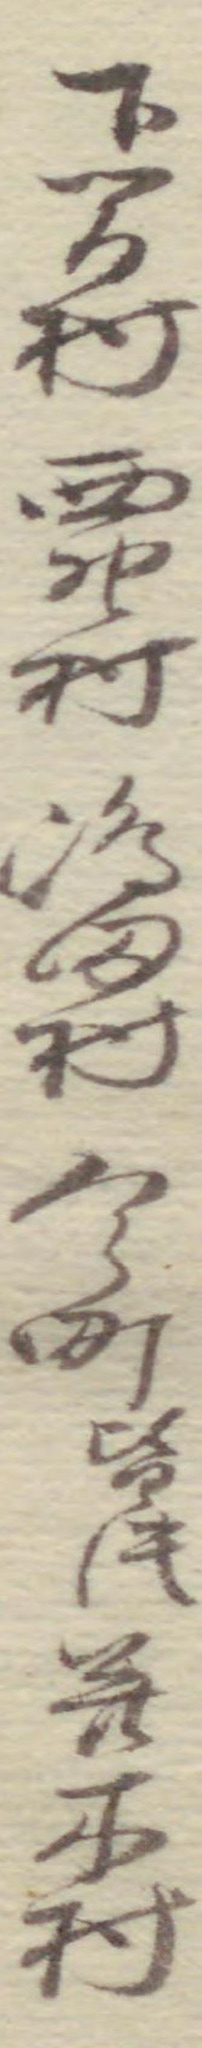下間村西野村島田村今町皆潰谷木村
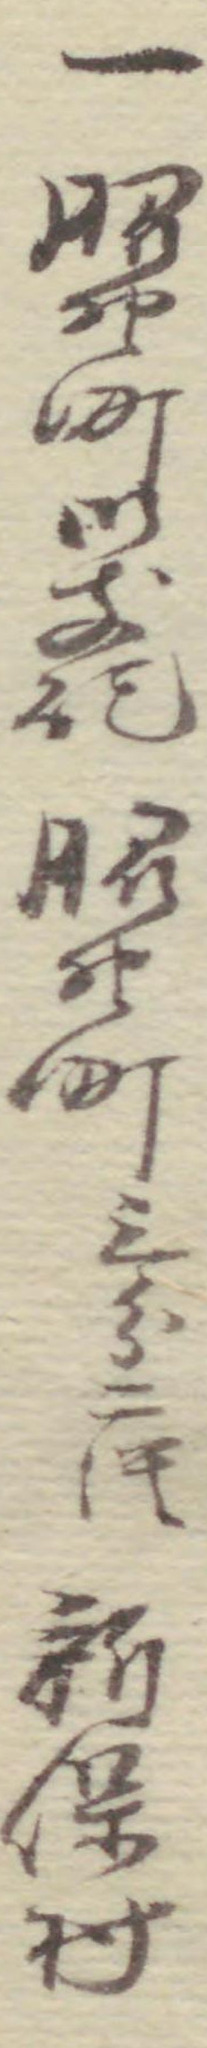一脇野町御支配脇野町三分二潰新保村
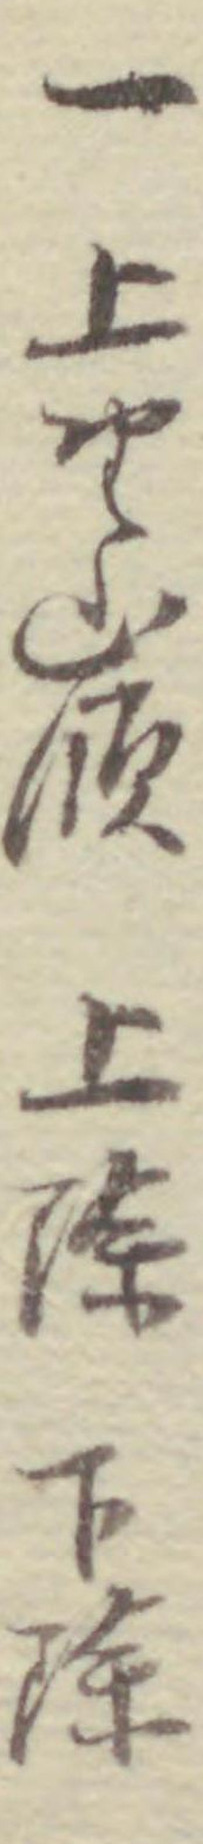一上野山領上除下除
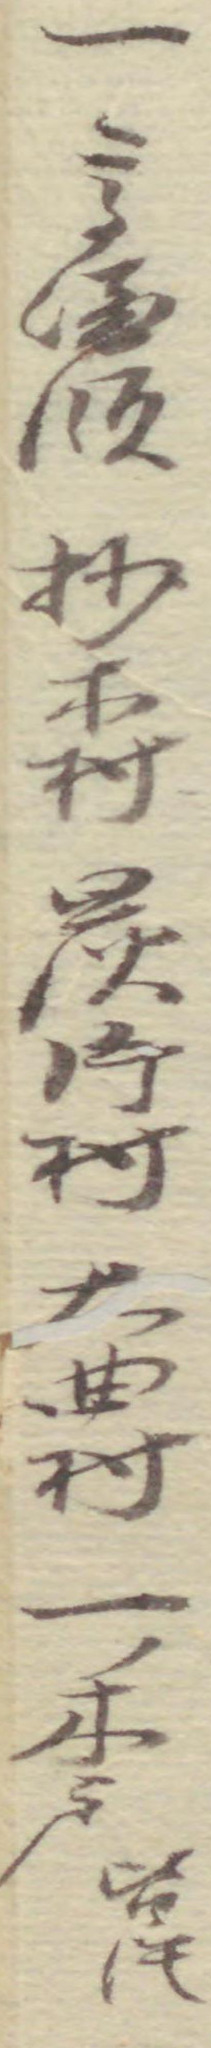一高崎領抄木村炭片村大曲村一ノ木戸皆潰
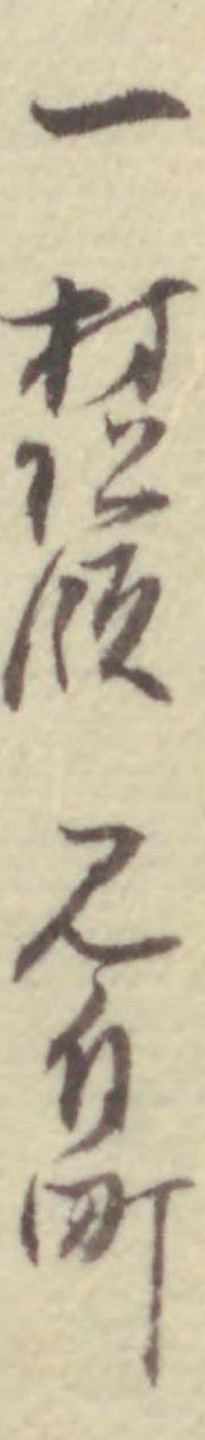一村松領見付町
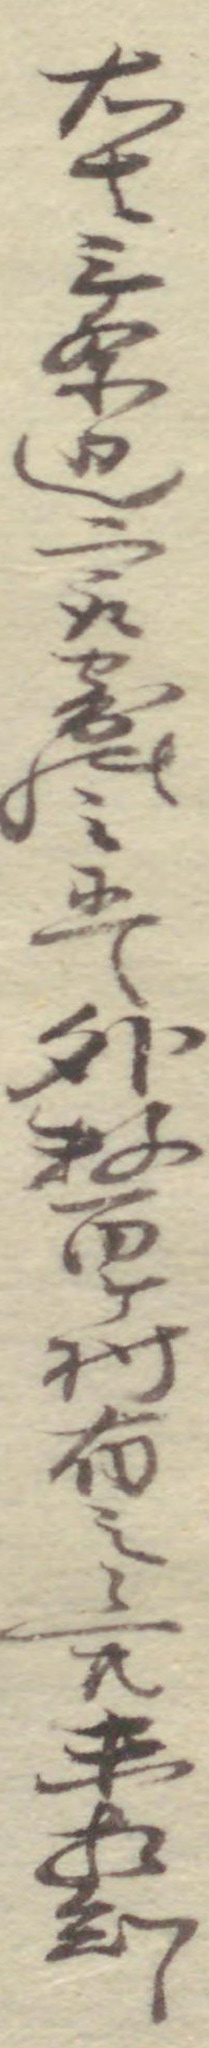右は三条辺最寄料〻にて外数百村有之候へ共未相知候
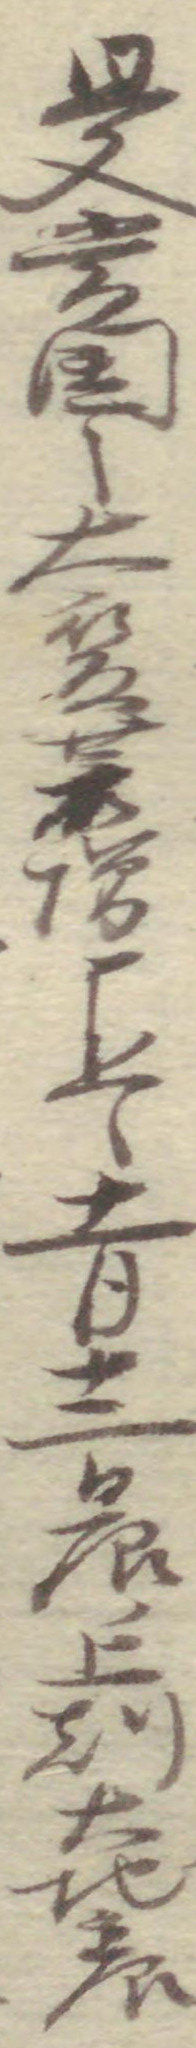且又貴国之大変荒増申上候十一月十二日辰上刻大地震
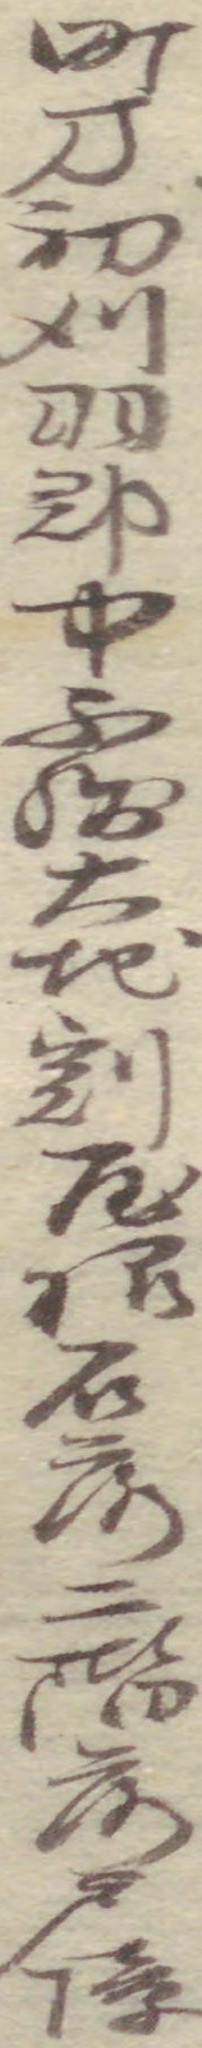町方初刈羽郡中不残大地割屋根石落二階落戸障
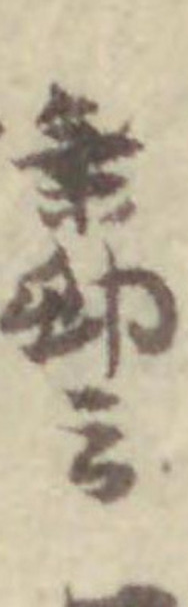乗邨云
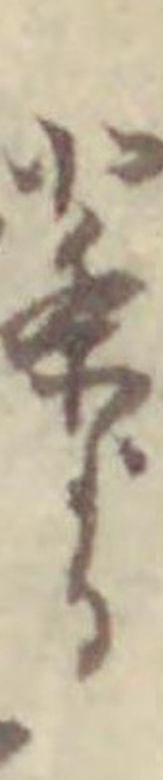北条より
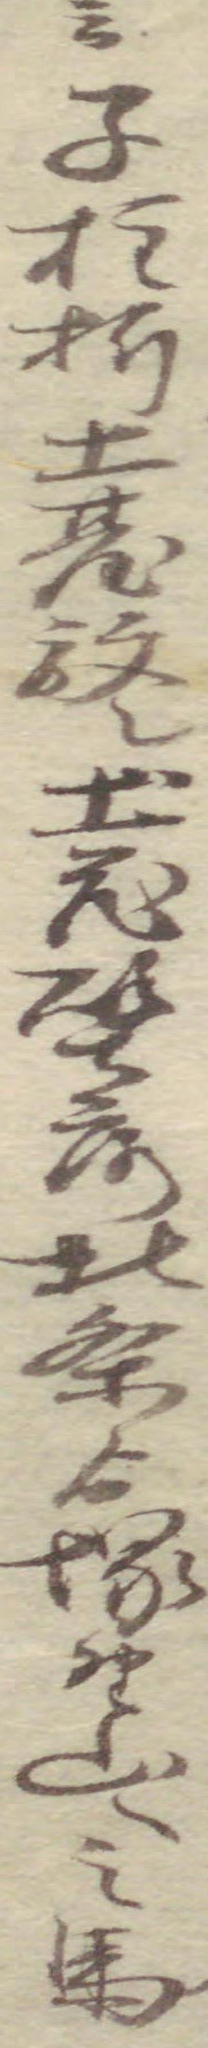子柱折土台離レ土蔵壁落北条ゟ塚野山への馬
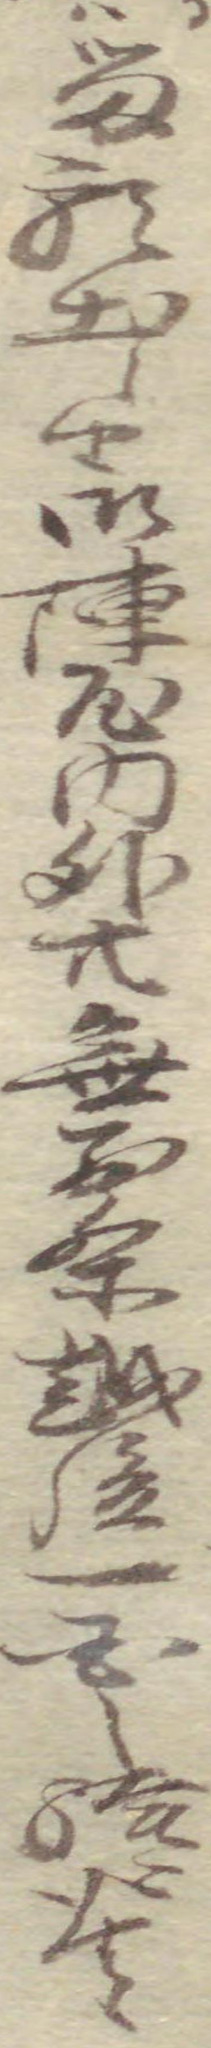留顔出候由御陣屋内外共無別条越後一国之騒ニ御座候
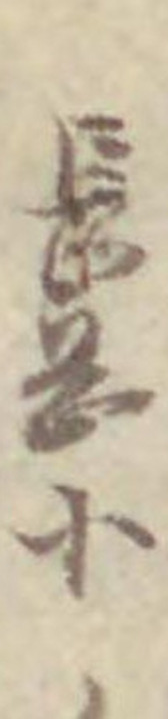長岡小
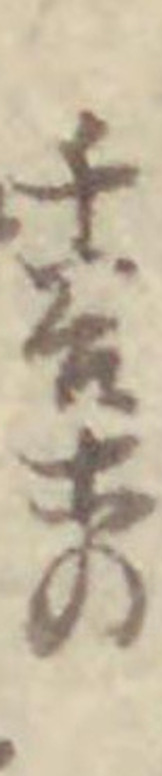千谷等の
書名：鶯宿雑記. 巻199-200
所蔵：国立国会図書館 National Diet Library, JAPAN
